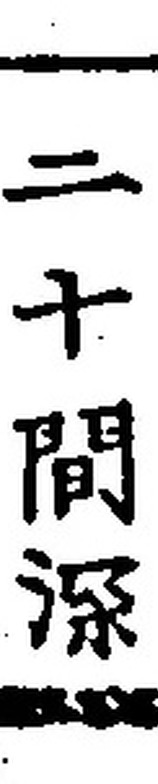二十間深
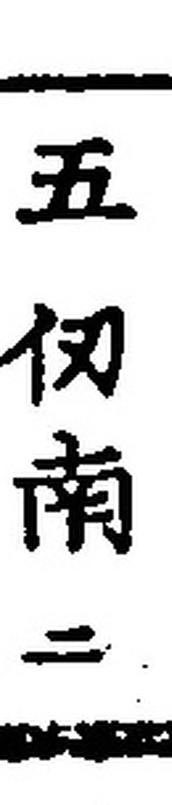五仞南ニ
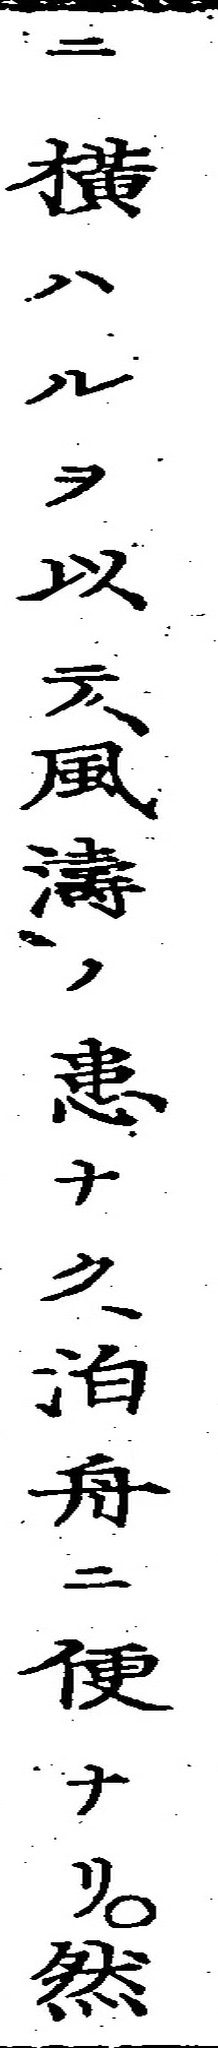ニ横ハルヲ以テ、風濤ノ患ナク、泊舟ニ便ナリ。然
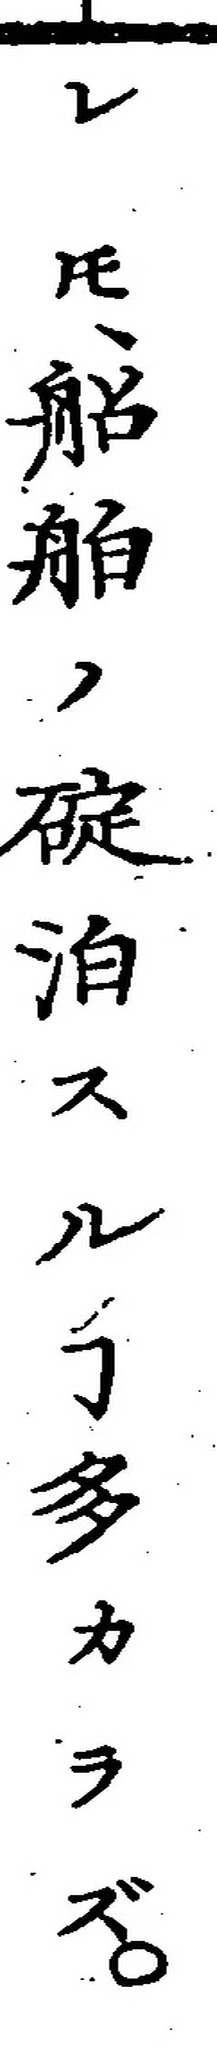レ𪜈、船舶ノ碇泊スルヿ多カラズ。

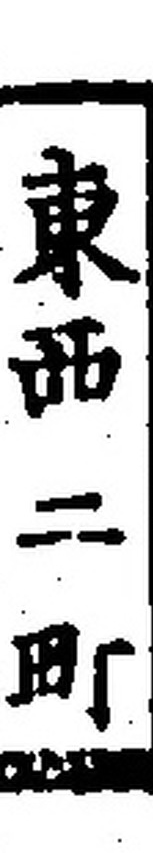東西二町
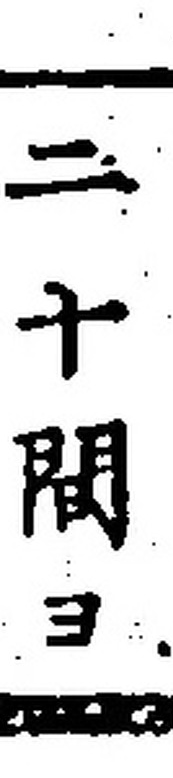二十間ヨ
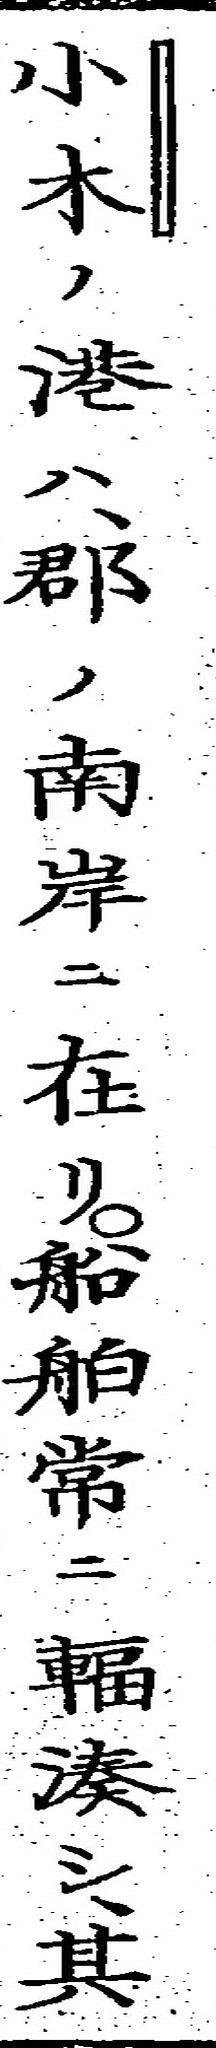小木ノ港ハ、郡ノ南岸ニ在リ。船舶常ニ輻湊シ、其
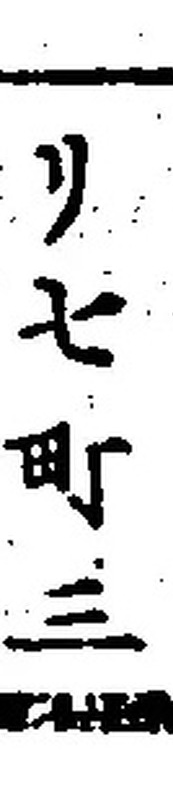リ七町三
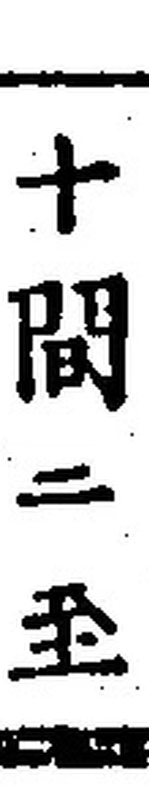十間ニ至
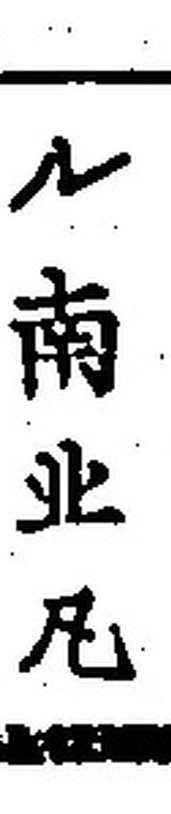ル南北凡
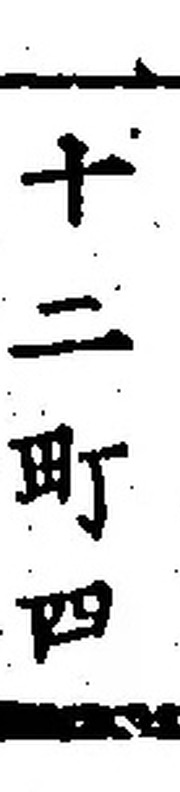十二町四
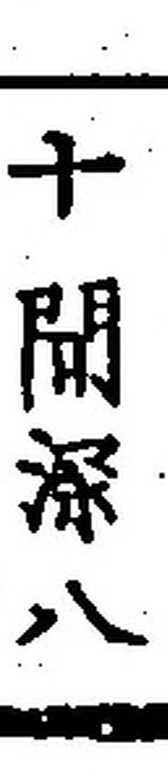十間深八
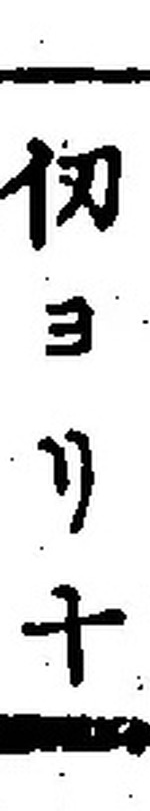仞ヨリ十
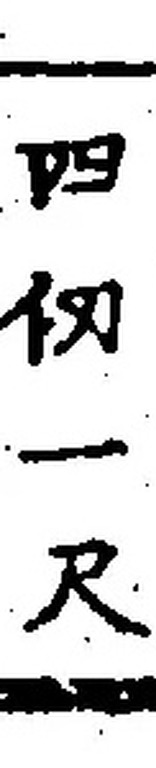四仞一尺
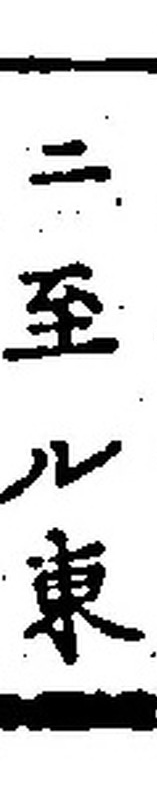ニ至ル東
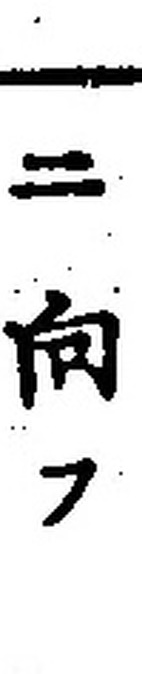ニ向フ
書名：能登地誌略
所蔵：国立国会図書館 National Diet Library, JAPAN
